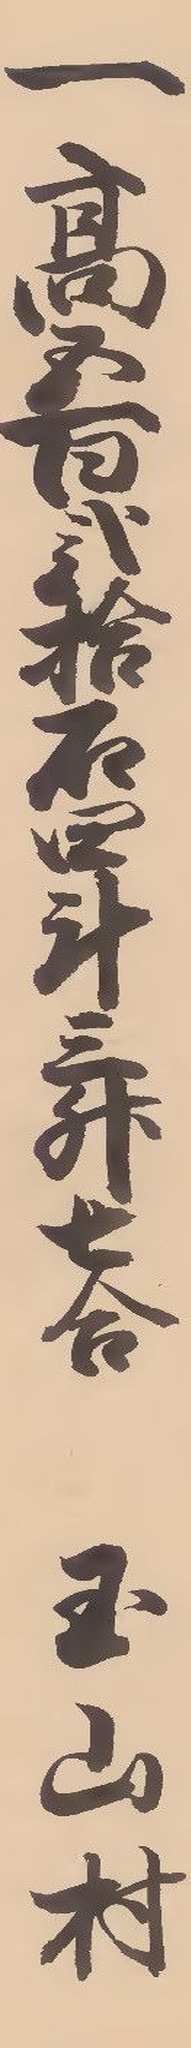一高五百弐拾石四斗三升七合玉山村

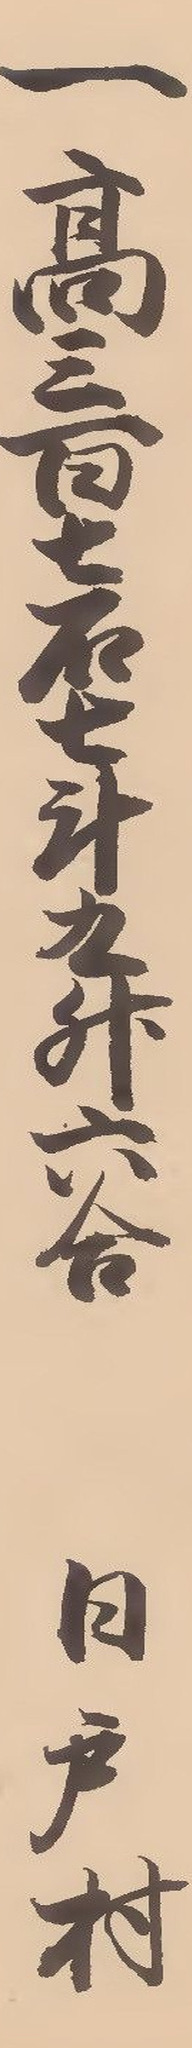一高三百七石七斗九升六合日戸村
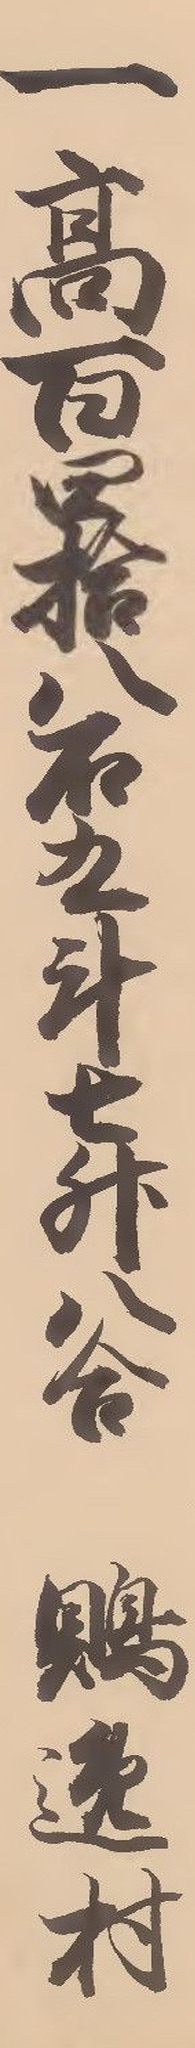一高百四拾八石九斗七升八合鵙逸村
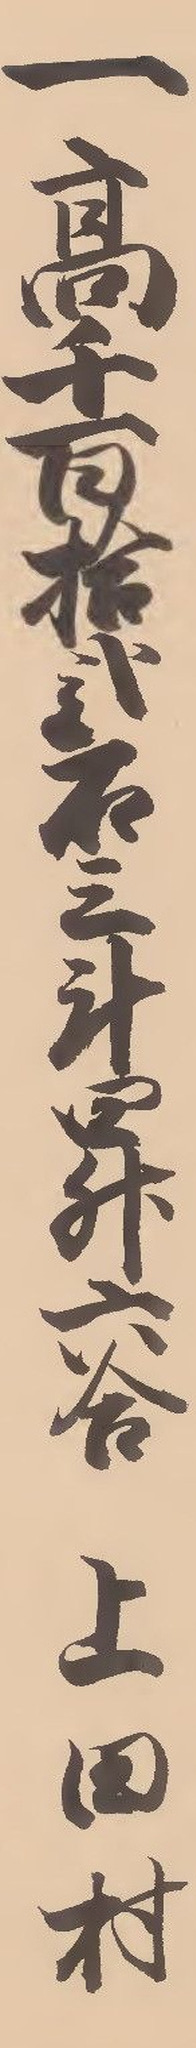一高千百拾弐石三斗四升六合上田村
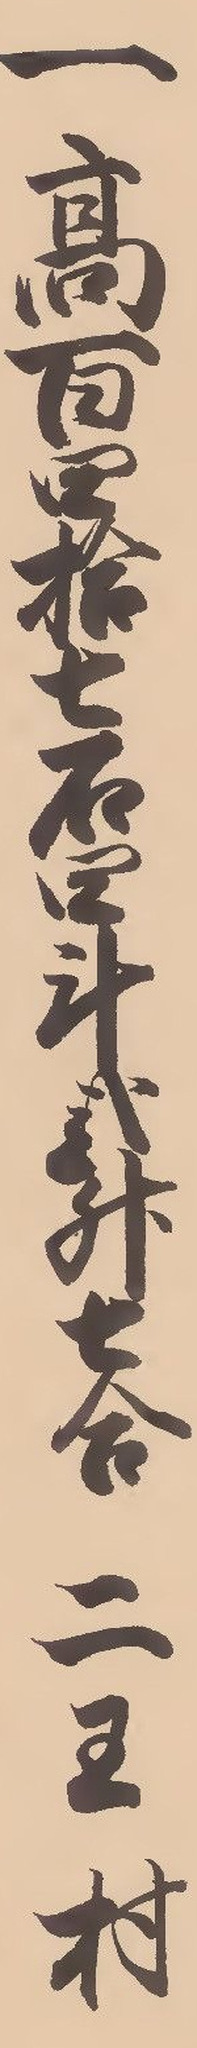一高百四拾七石四斗弐升七合二王村
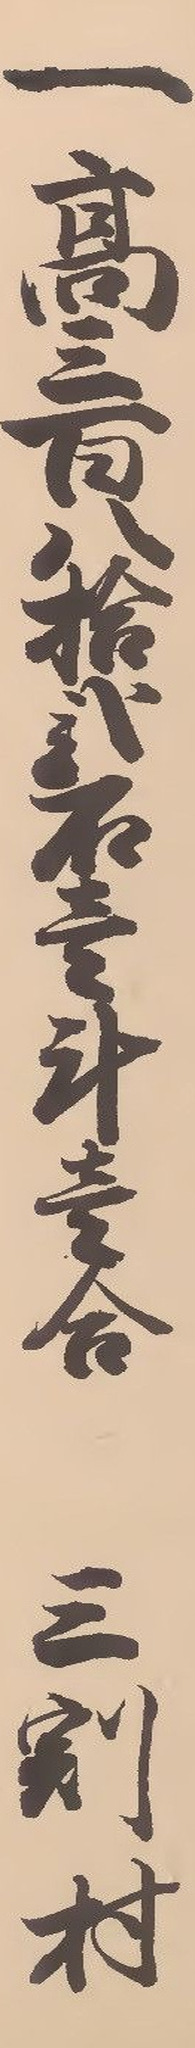一高三百八拾弐石壱斗壱合三割村
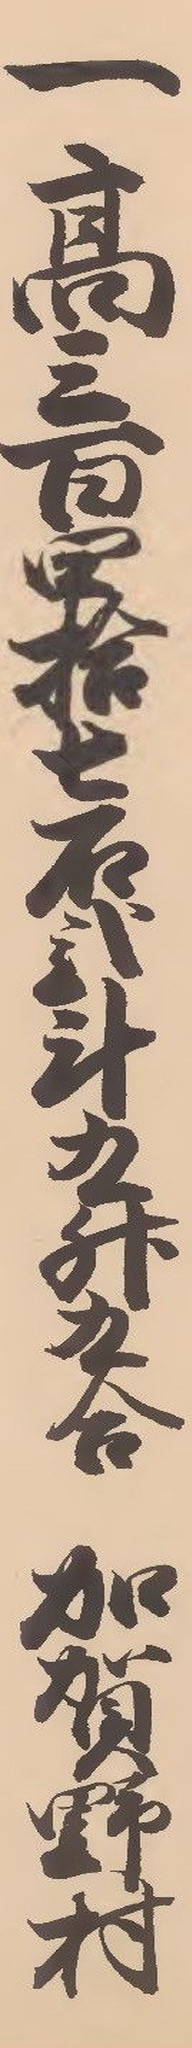一高三百四拾七石弐斗九升九合加賀野村
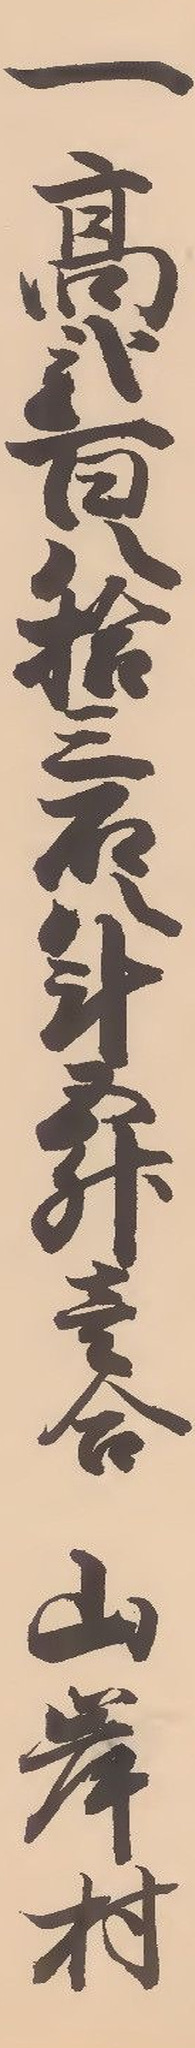一高弐百八拾三石八斗五升壱合山岸村
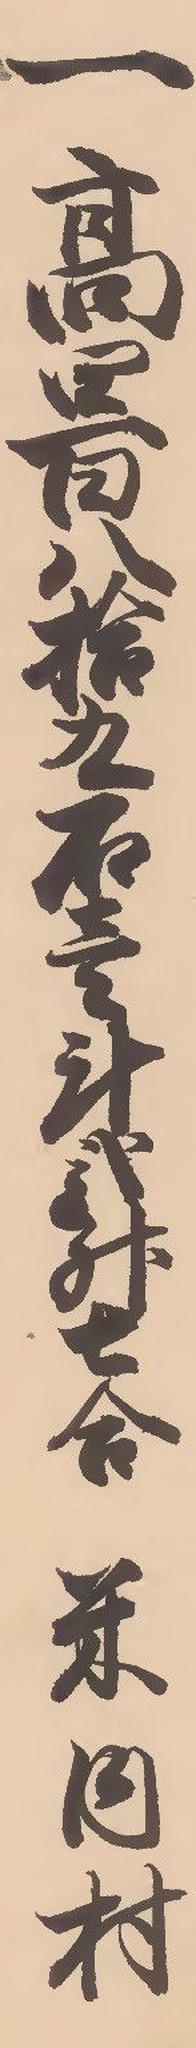一高四百八拾九石壱斗弐升七合米内村

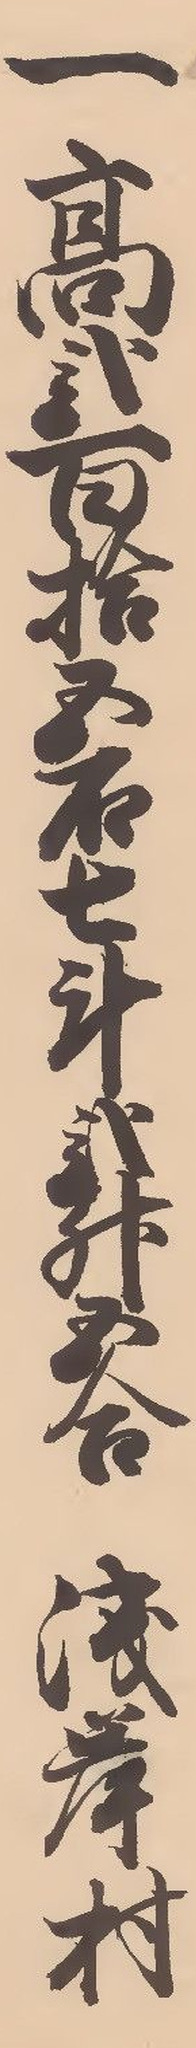一高弐百拾五石七斗弐升五合浅岸村
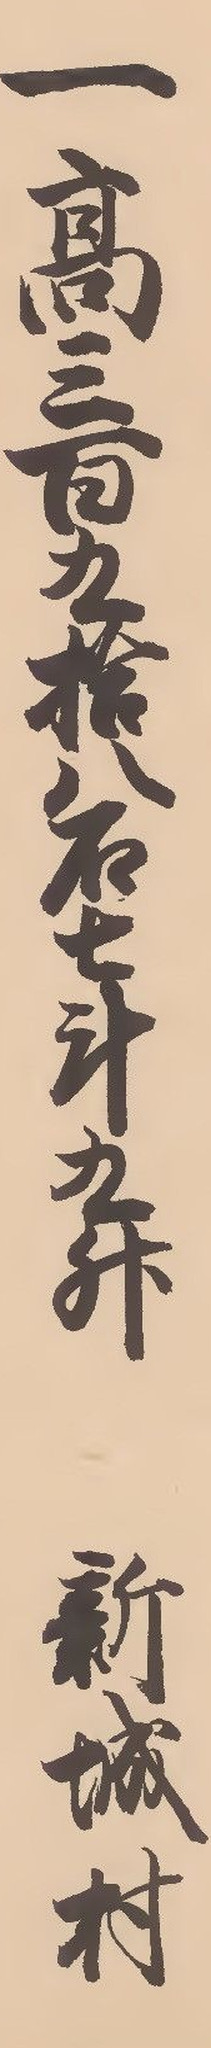一高三百九拾八石七斗九升新城村
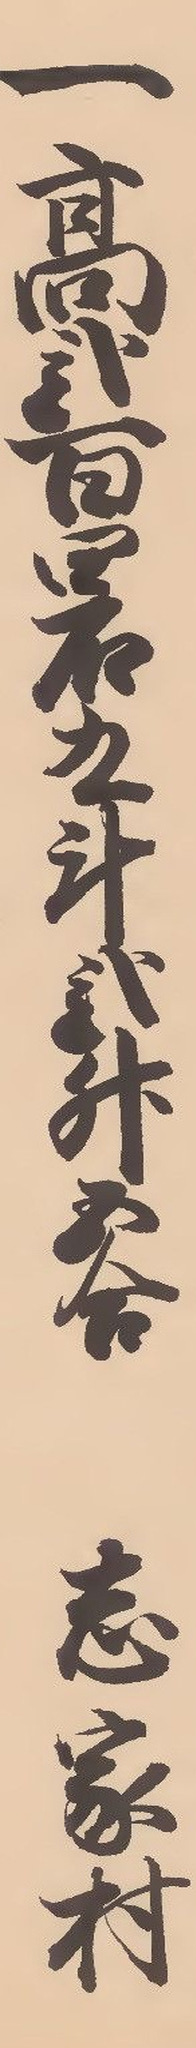一高弐百四石九斗弐升五合志家村
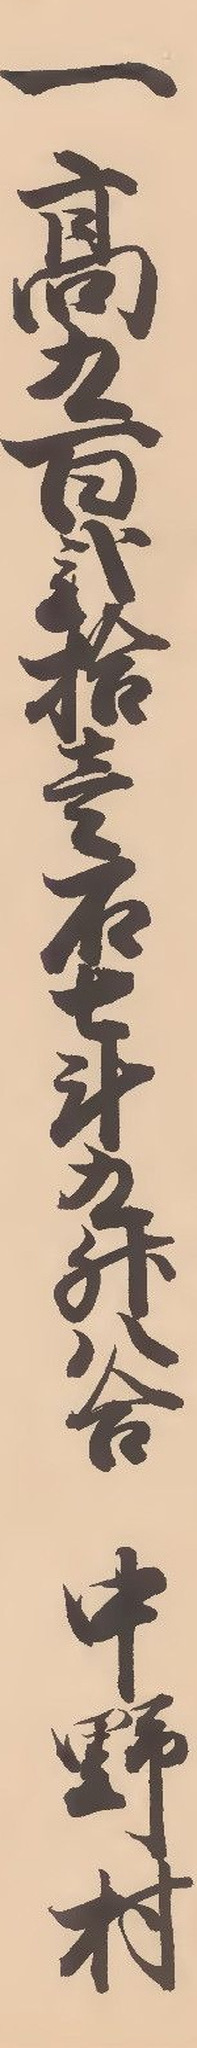一高九百弐拾壱石七斗九升八合中野村
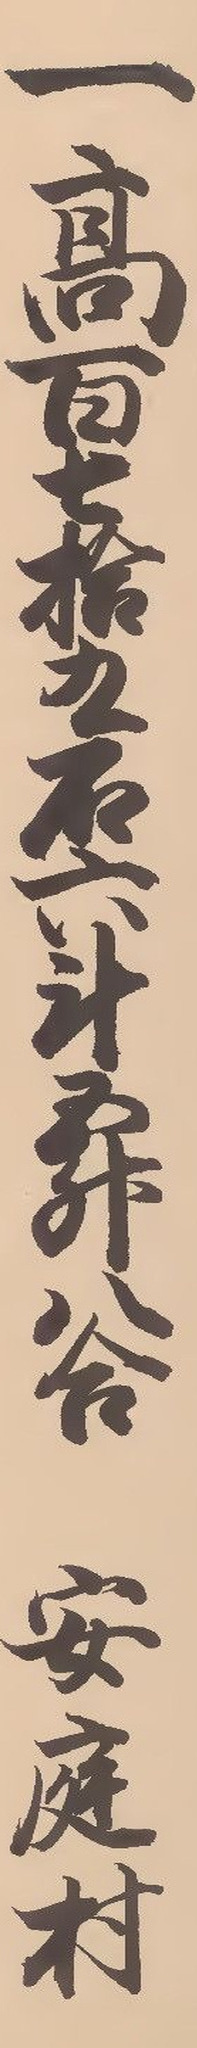一高百七拾九石六斗五升八合安庭村
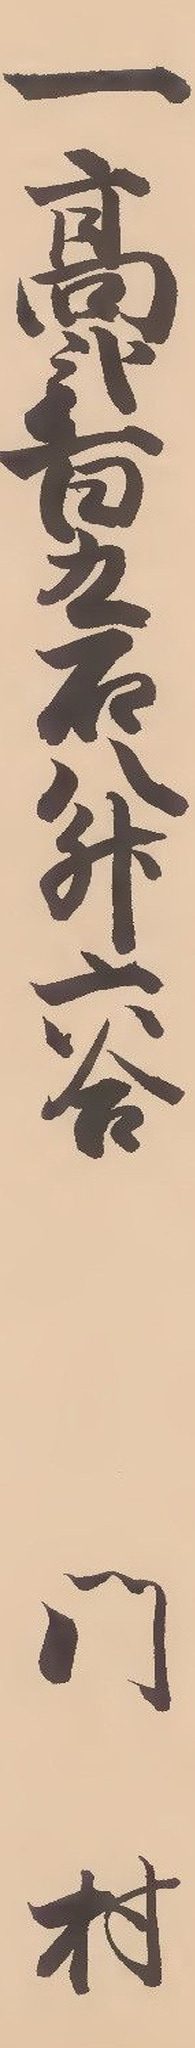一高弐百九石八升六合門村
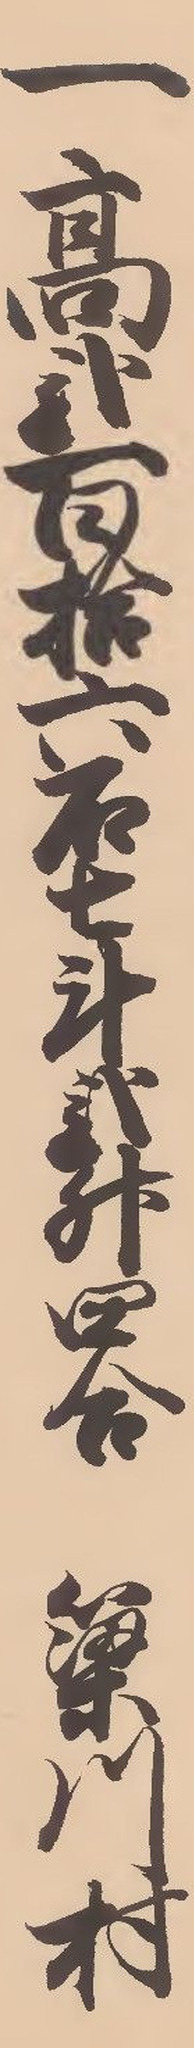一高弐百拾六石七斗弐升四合簗川村
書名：陸奥国郷帳　６
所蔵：国立公文書館 National Archives of Japan
